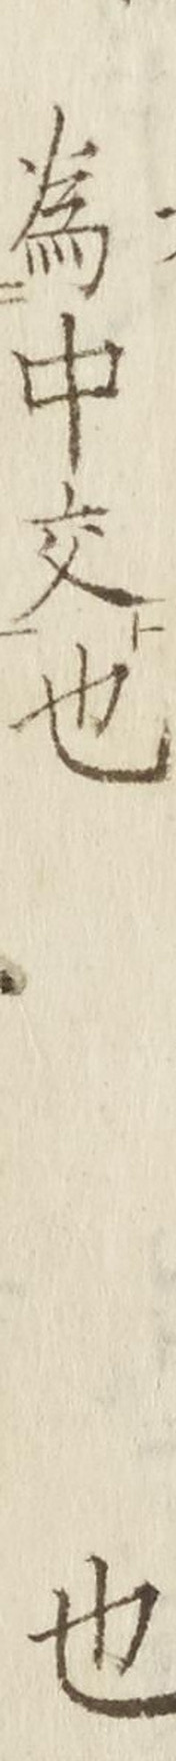為中交

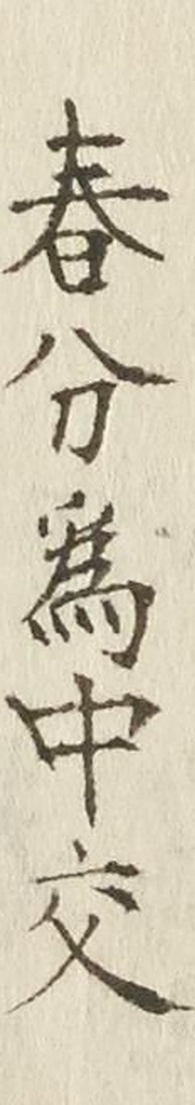春分為中交
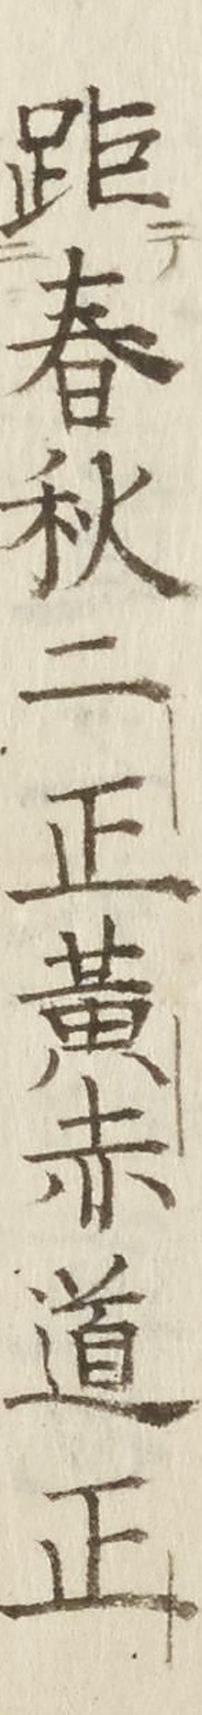距テニ春秋二正黄赤道正
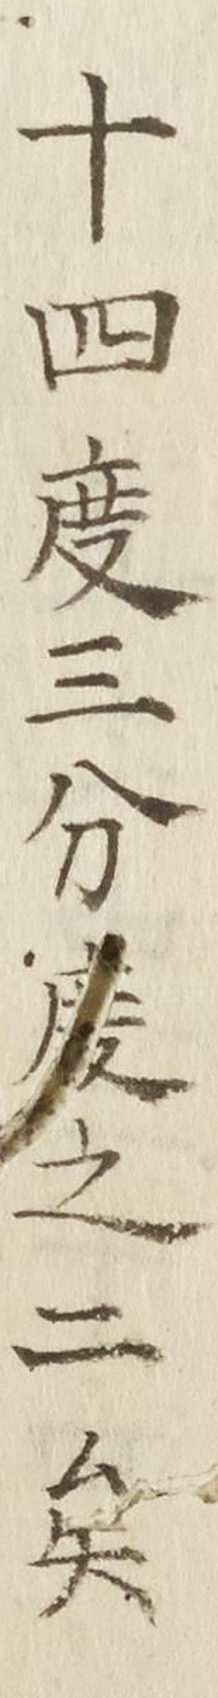十四度三分度之二矣

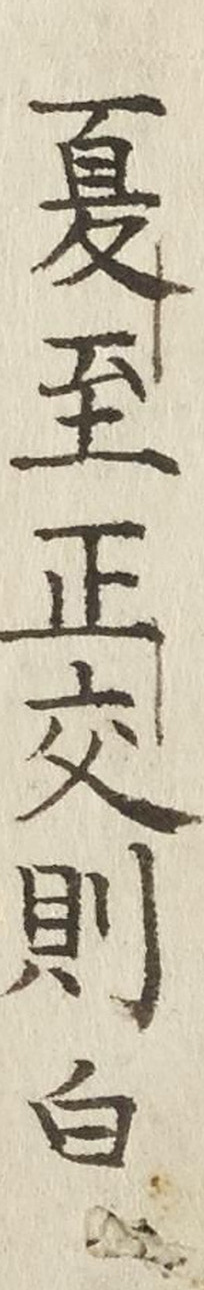夏至正交則白
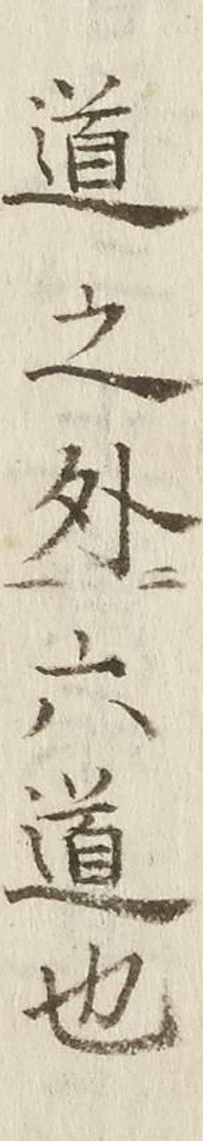道之外六道也
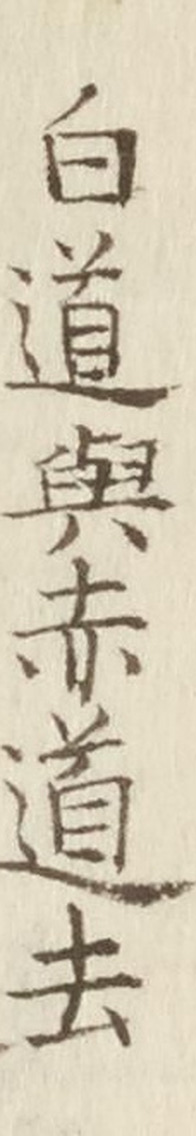白道与赤道去
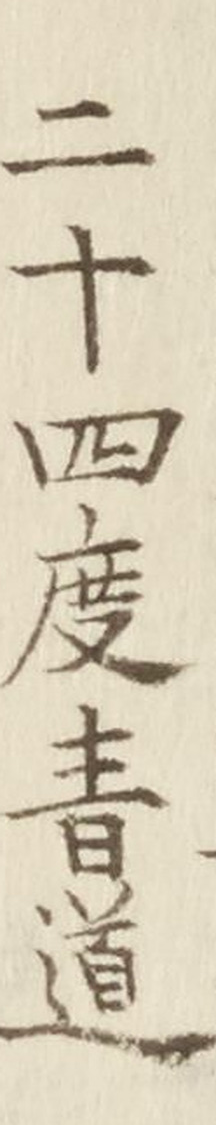二十四度青道
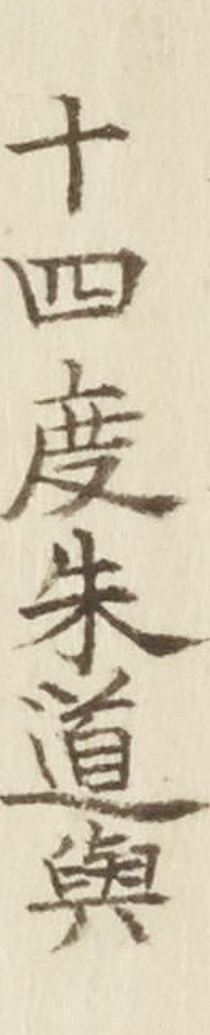十四度朱道与
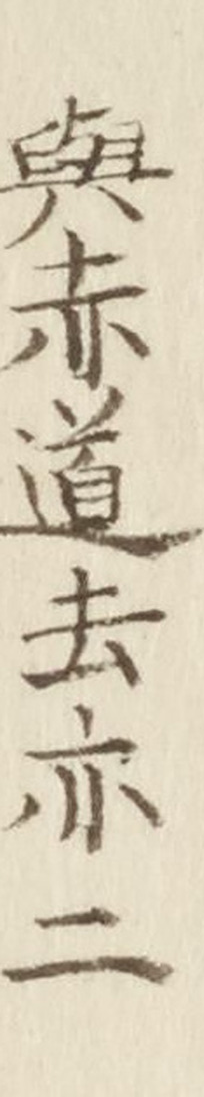与赤道去亦二
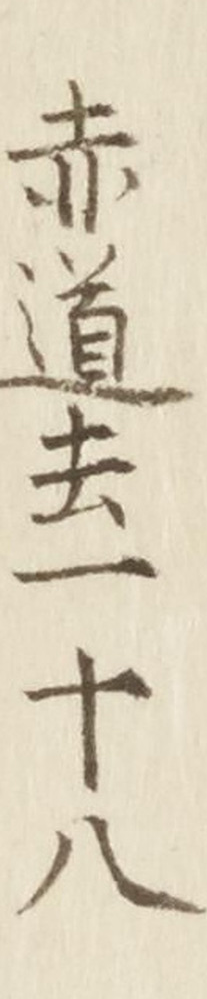赤道去一十八
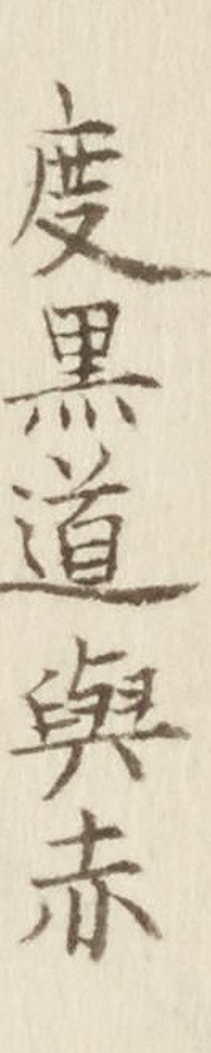度黒道與赤
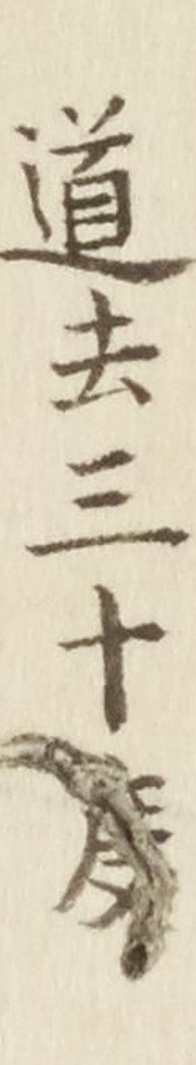道去三十度
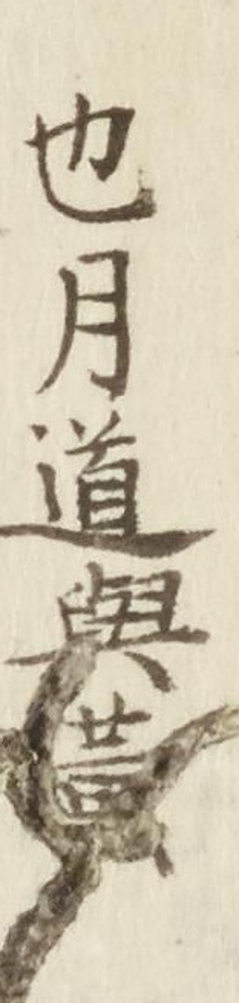也月道与黄
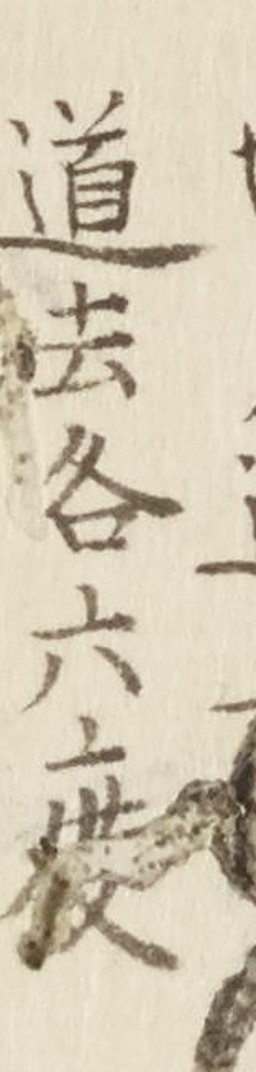道去各六度
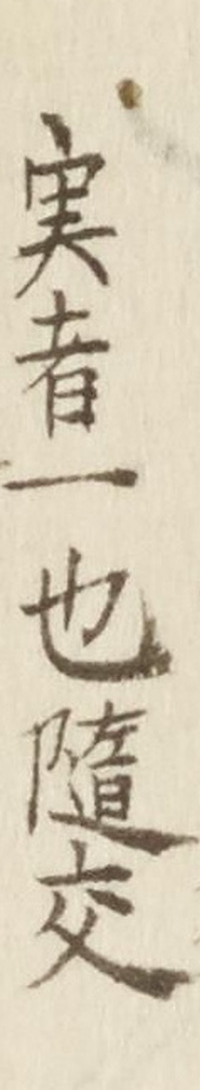実者一也随交
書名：日食度
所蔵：東京大学地震研究所図書室 Earthquake Research Institute Library, The University of Tokyo, JAPAN
